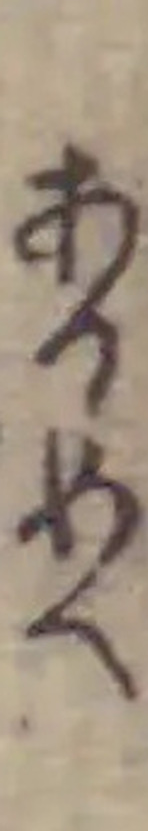あるめへ
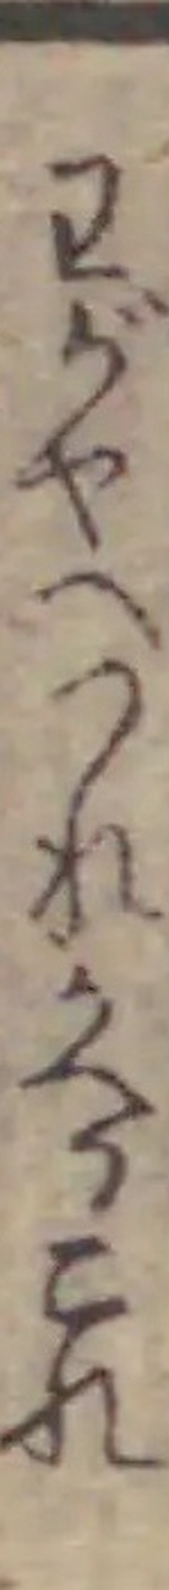わがやへつれかへるこれ
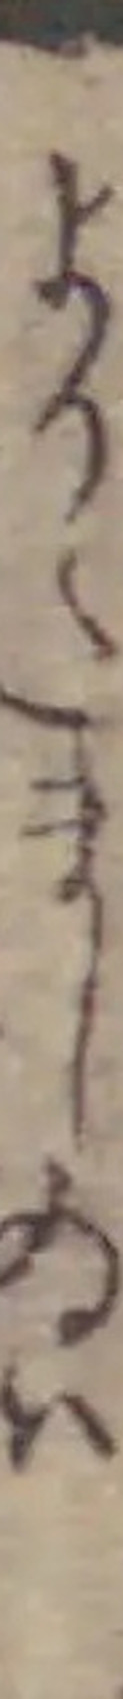よりたましゐは
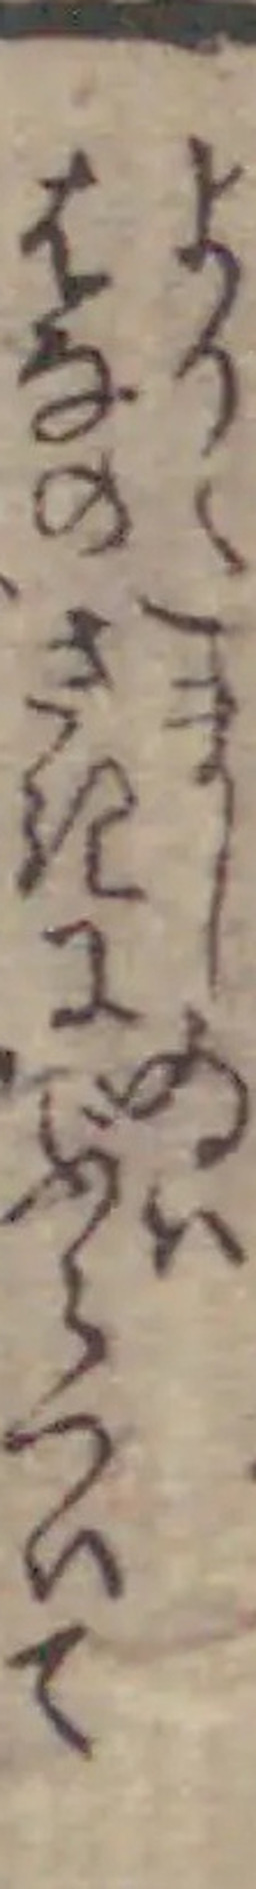はなのさきにぶらついて
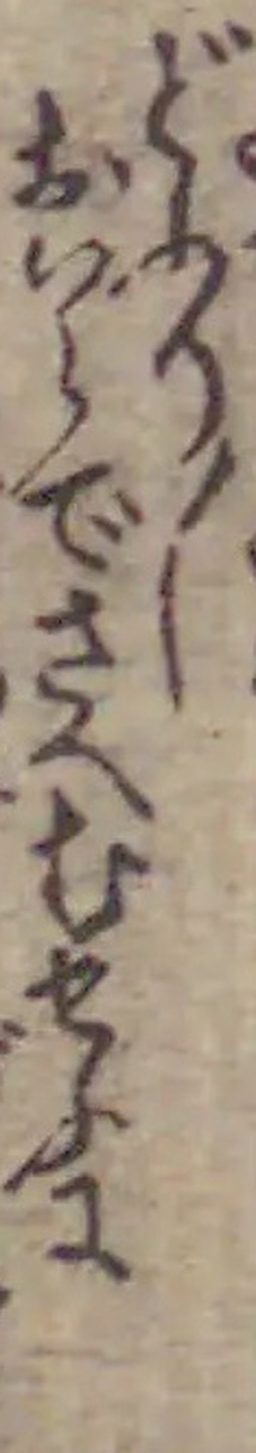おいらでさへむせふに
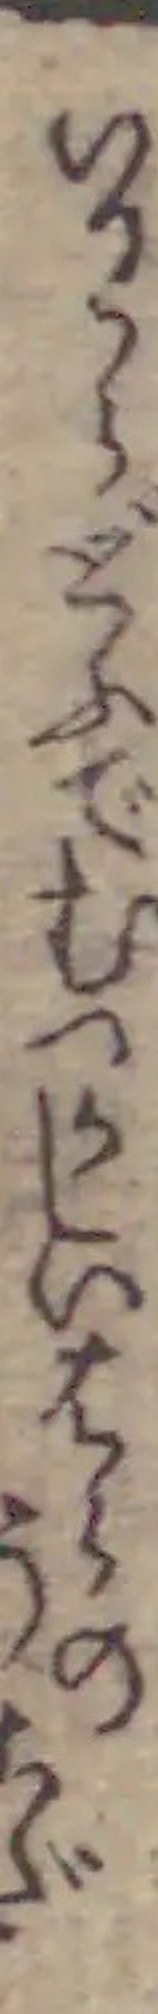いるからどふでむつかしいはらの
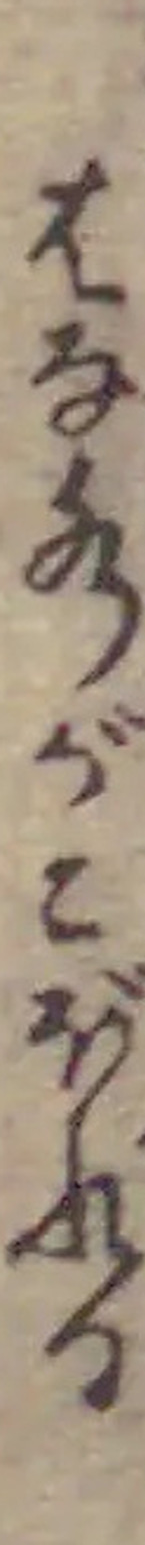はな水がこぼれる

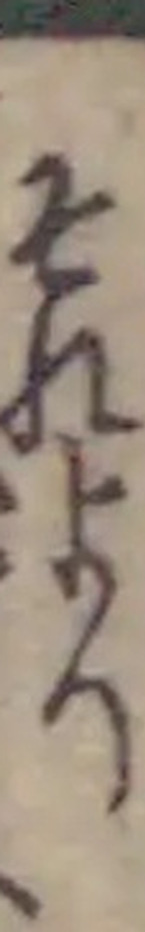それより
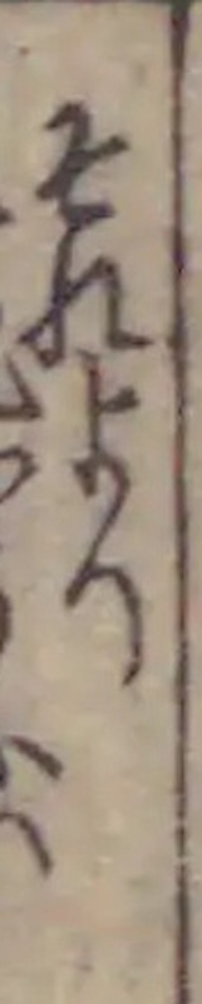それより
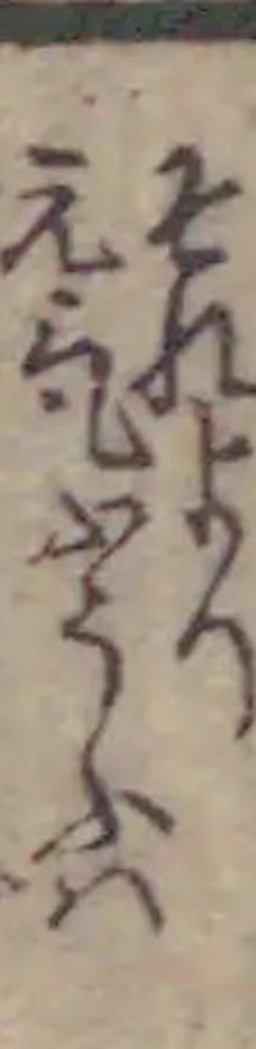元気ふうふは
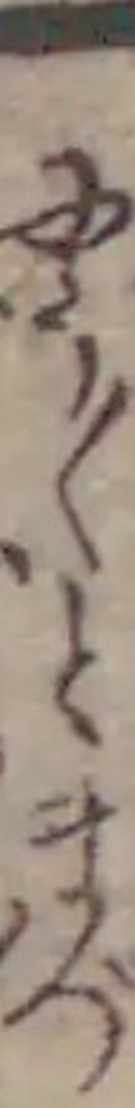やう〳〵とまづ
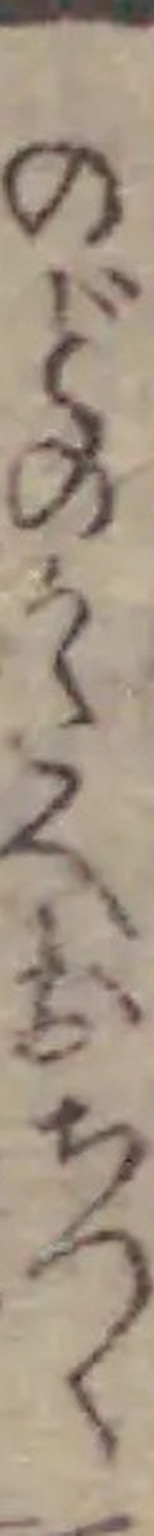のどのかたへおちつく
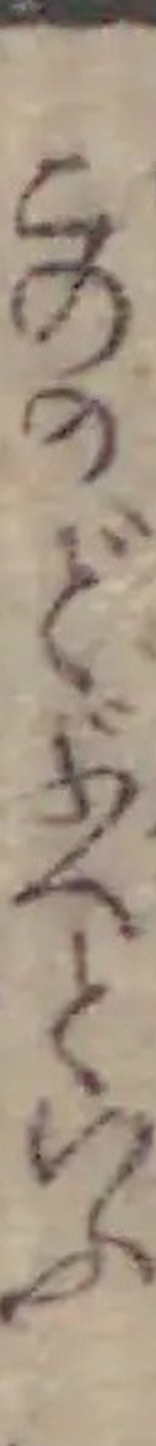こののどぶへといふ
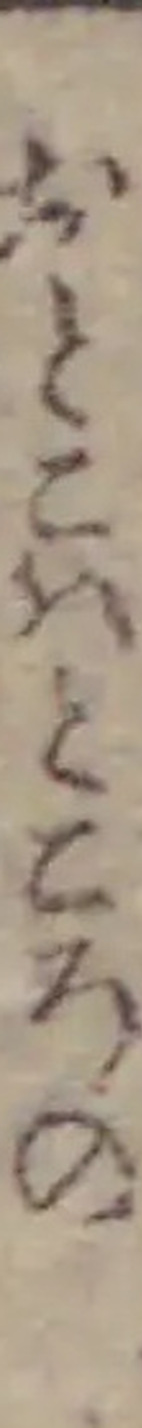おとこはところの
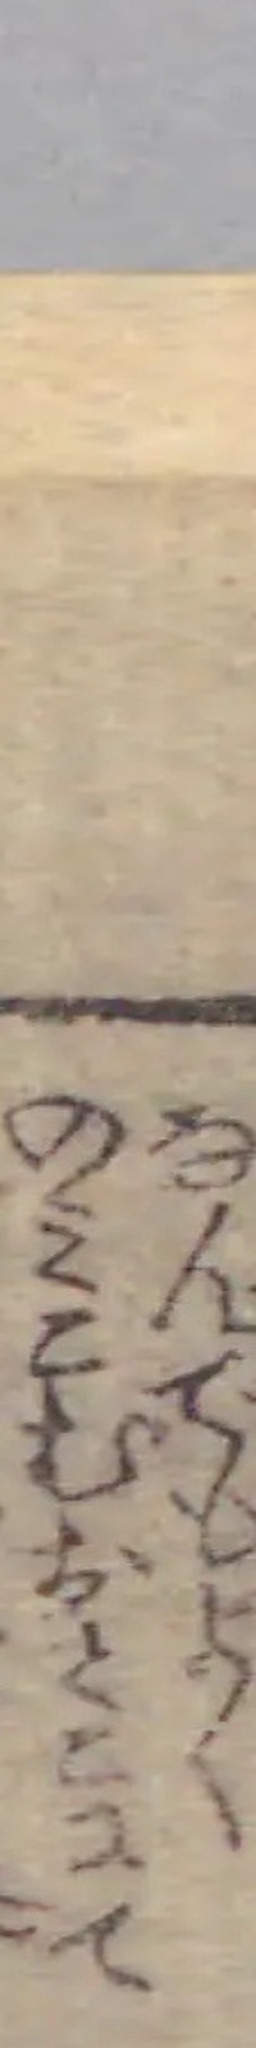のみこむおとこにて
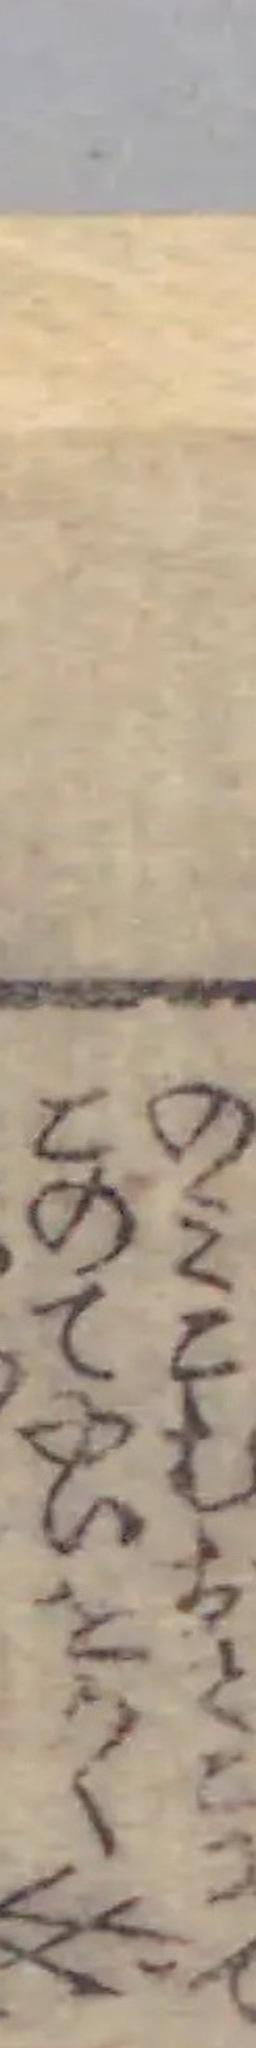このてやいをかく
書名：腹内養生主論 3巻
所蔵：国立国会図書館 National Diet Library, JAPAN
